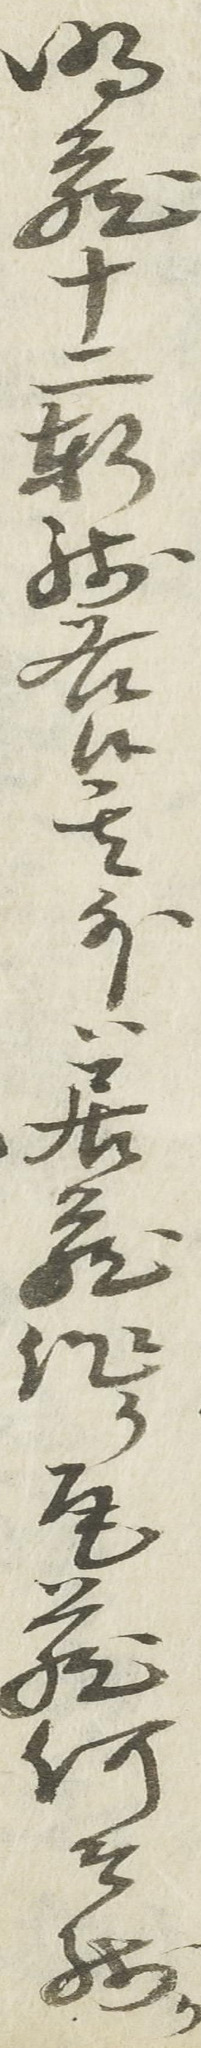明蔵十二軒残居候其外は居蔵作り瓦蔵何そ残り
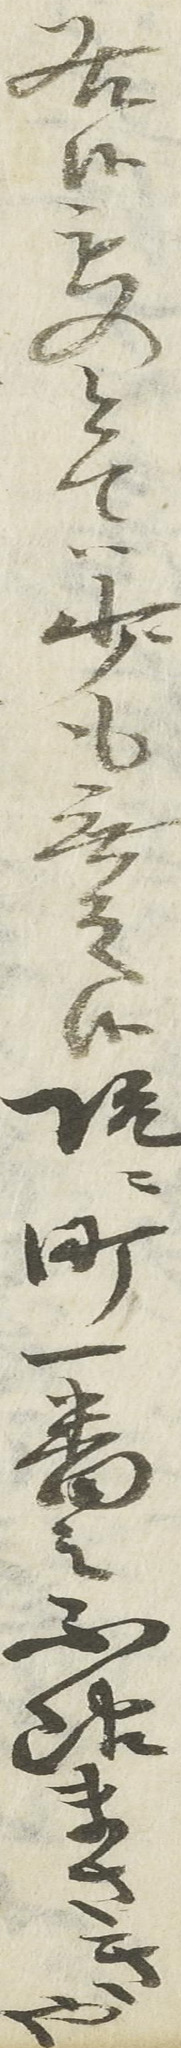居候ものとては少も無之候纔ニ町一番之不限まさきや
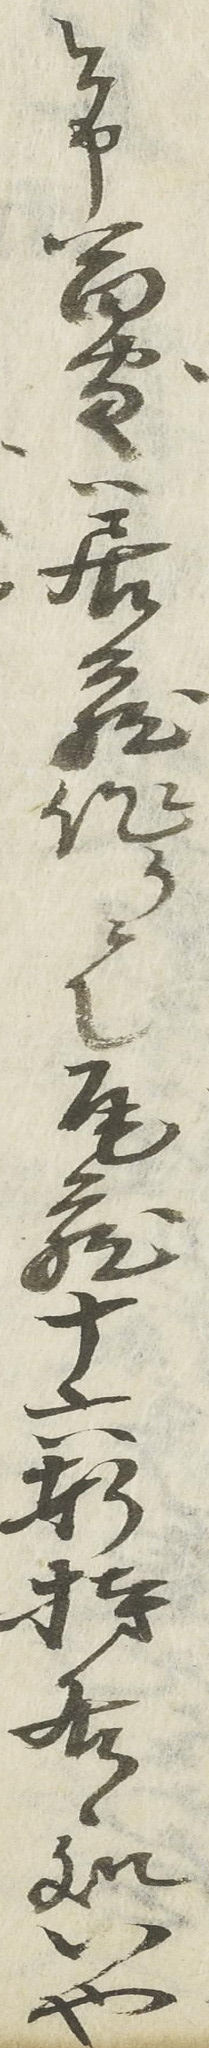と申富家は居蔵作りニて瓦蔵十六軒持居候処いや
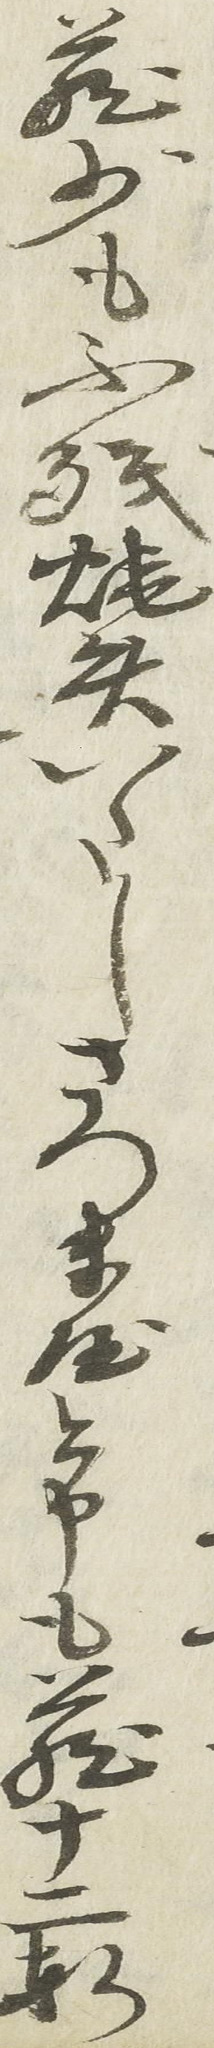蔵少も不残焼失いたしさつま屋と申も蔵十二軒
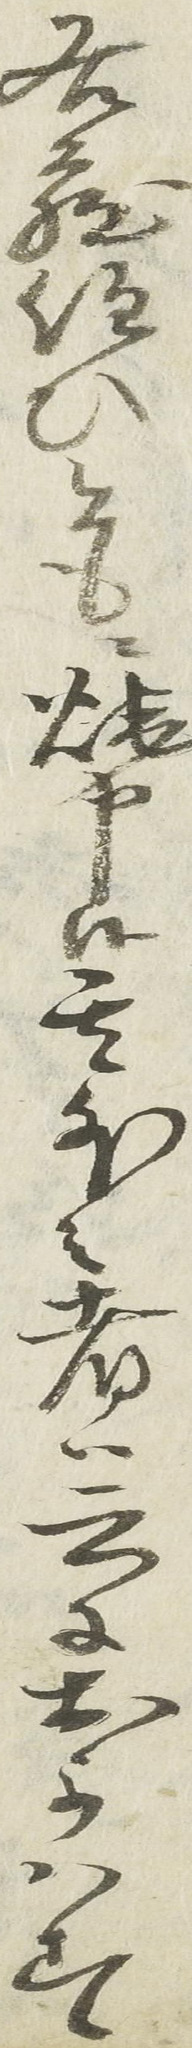居蔵住ひともニ焼申候其外之者は云におよはす
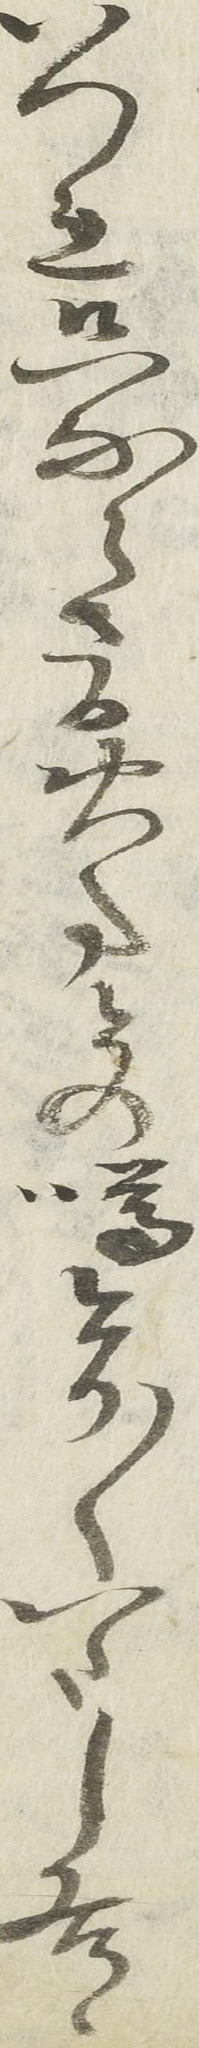いつれ只ならさる火事との噂とか〳〵いたし居候
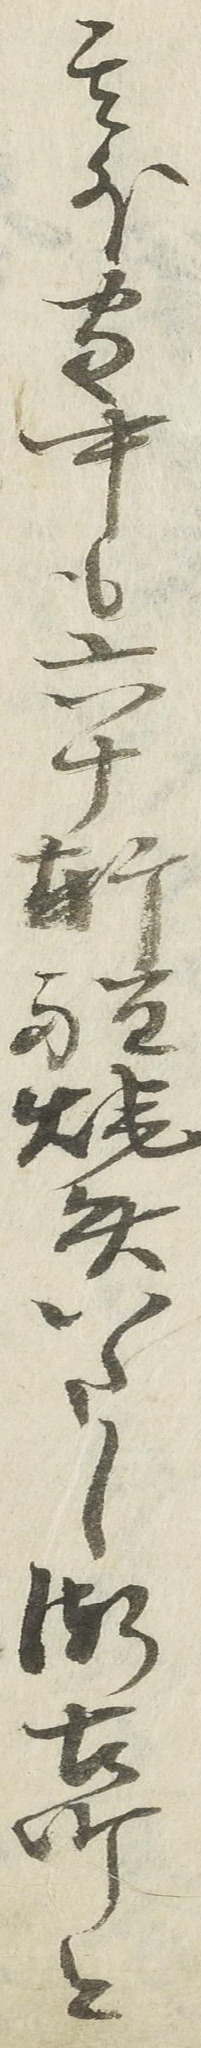其外家中も六十軒程焼失いたし漸古町と
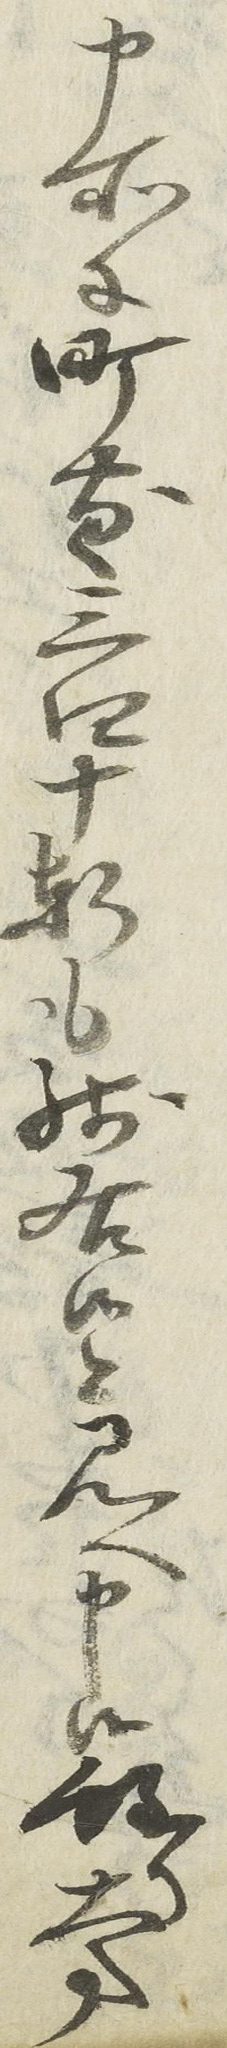申所に町家三四十軒も残居候と見ヘ申候余り大事
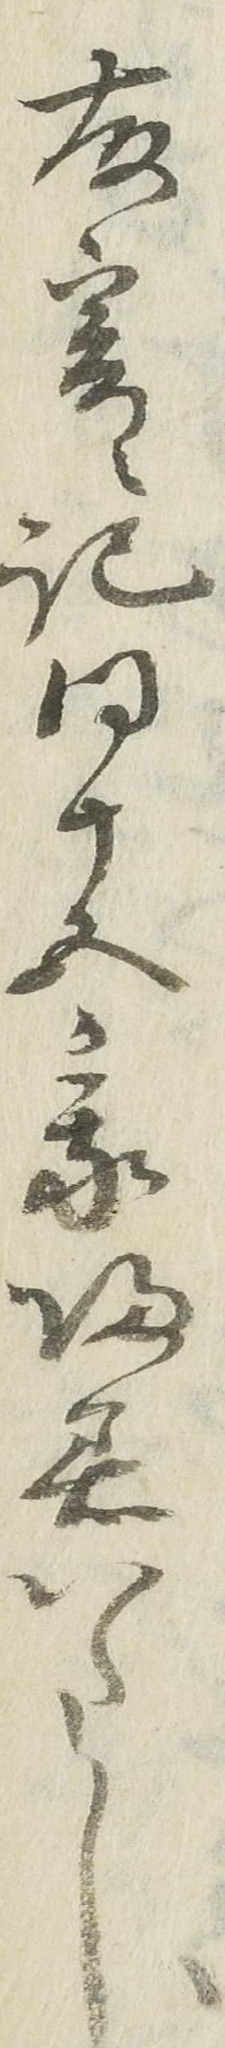故爰ニ記同十五日我帰着いたし候

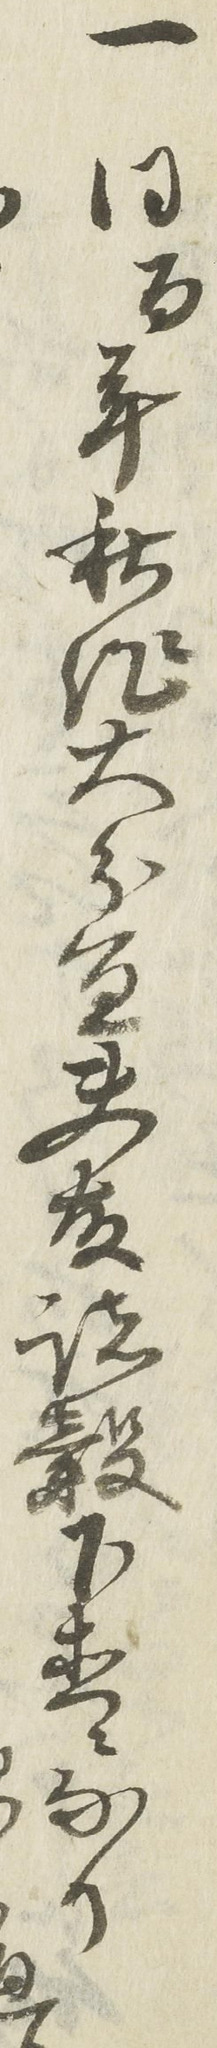一同酉年秋作大分宜夫故諸穀下直ニなり左之通り
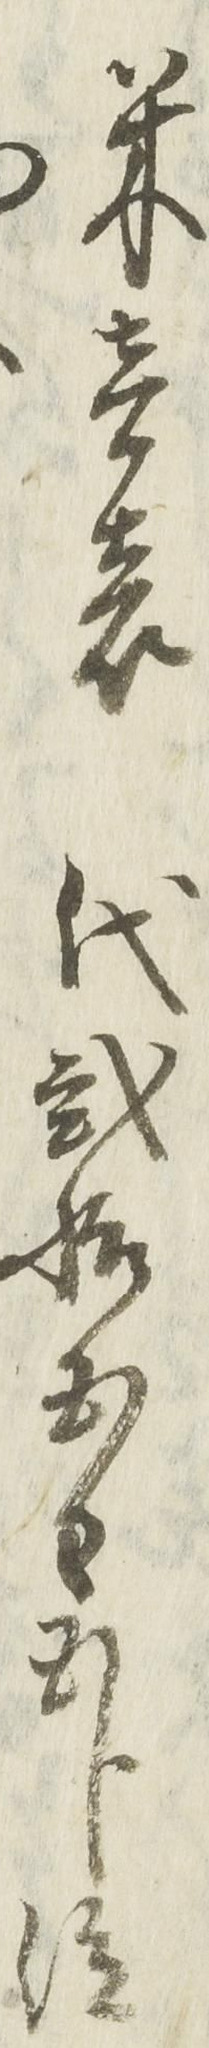米壱表代弐拾五匁五分位
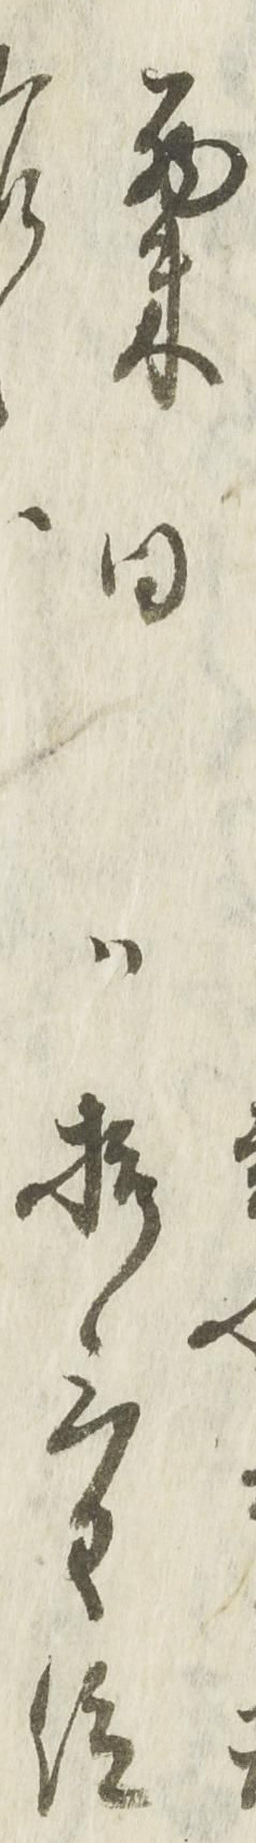粟同〃拾三匁位
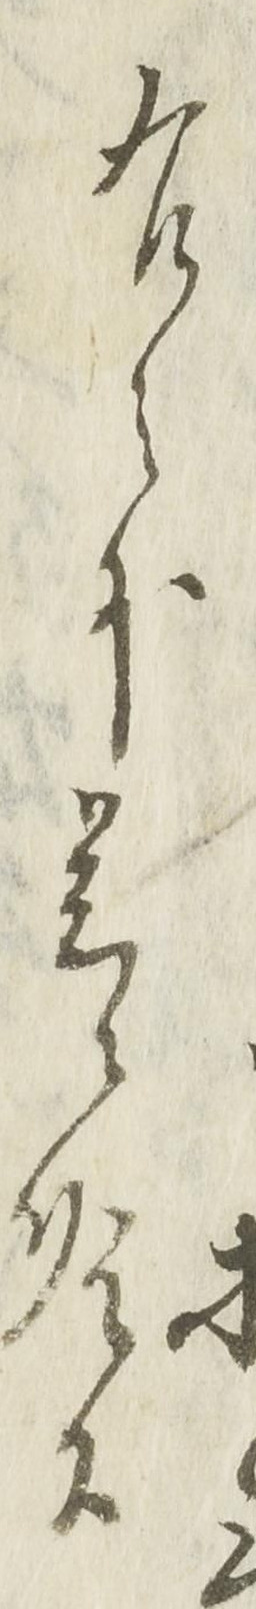右之外是ニ順ス
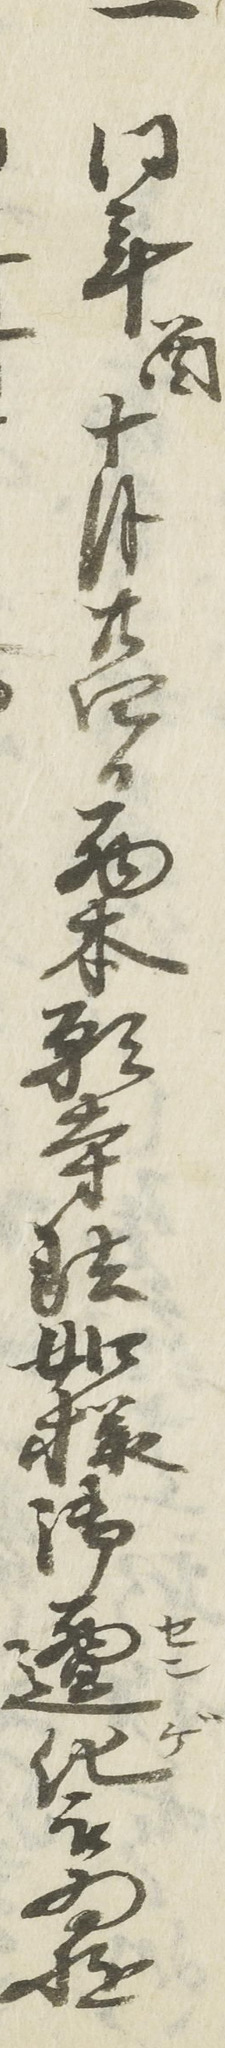一同年酉十月廿四日西本願寺法如様御遷化被為遊
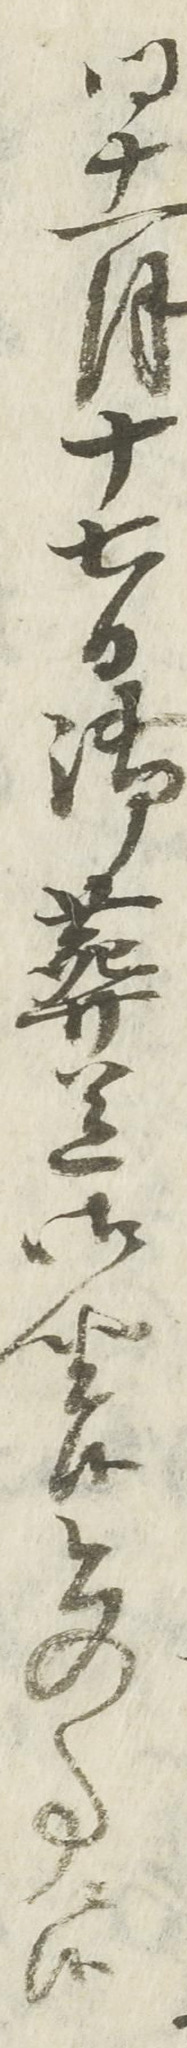同十一月十七日御葬送御坐候との事ニ候
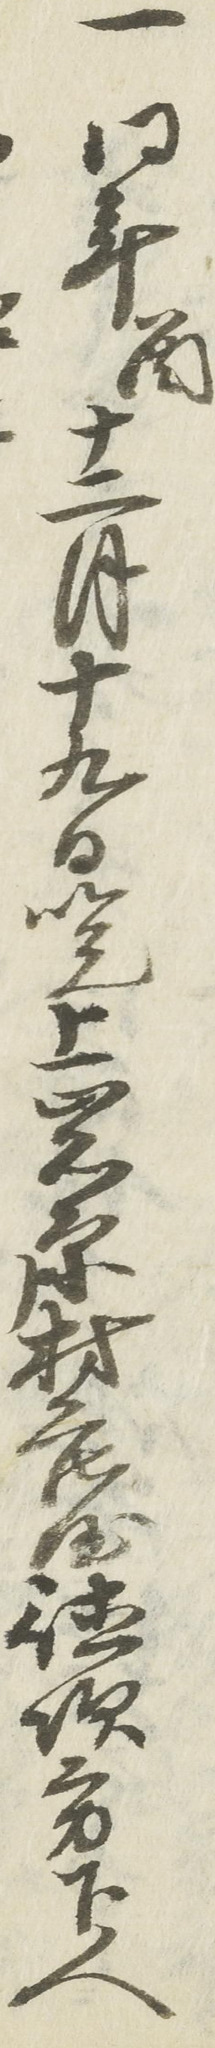一同年酉十二月十九日晩上岩原村庄屋徳次方下人
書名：後見笑
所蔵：東京大学地震研究所図書室 Earthquake Research Institute Library, The University of Tokyo, JAPAN
